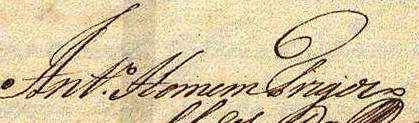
Ant.o Homem Fragozo
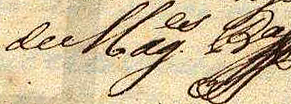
de Mag.es Pr.a
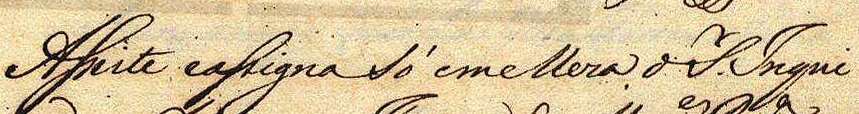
Asseite e assigna só em Meza o S.r Inqui
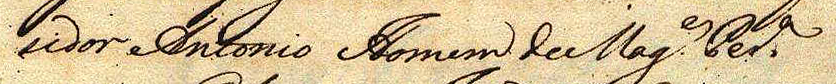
zidor Antonio Homem de Mag.es Per.a
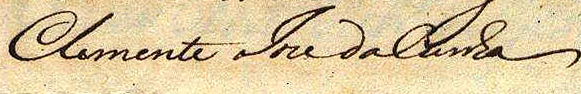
Clemente Ioze da Cunha
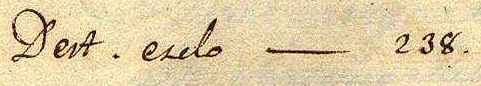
Dest. e selo ‒ 238.
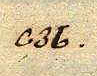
C36.
